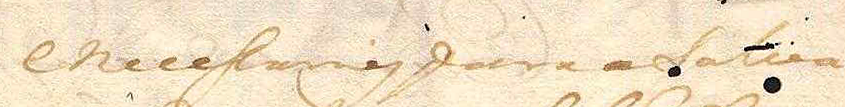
e necessarios para a Salva
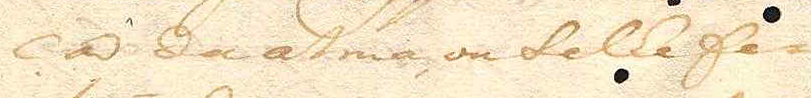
çaõ da alma, ou se lhe fez
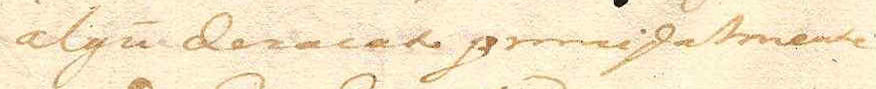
algū dezacato principalmente
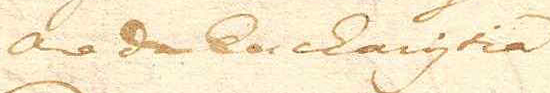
ao da horcharistia
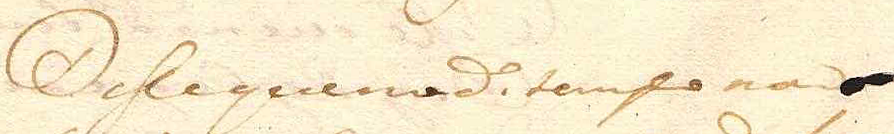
Disse que no d.o tempo naõ
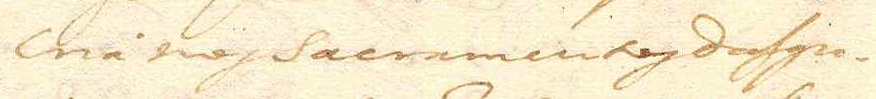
cria nos Sacramentos da Jgre
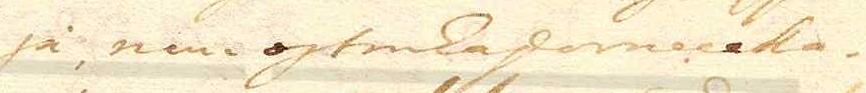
já, nem os tinha por necessa
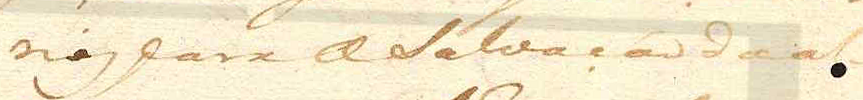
rios para a Salvaçaõ da al
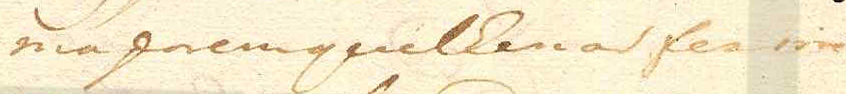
ma porem que lhe naõ fez irre
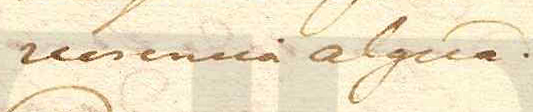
verencia alguā.
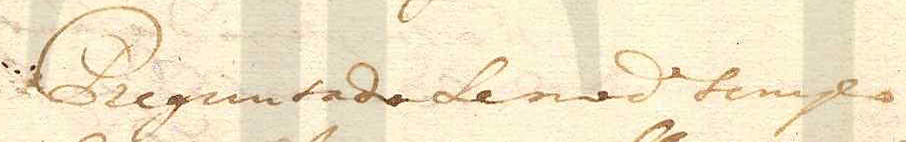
Preguntada se no do tempo
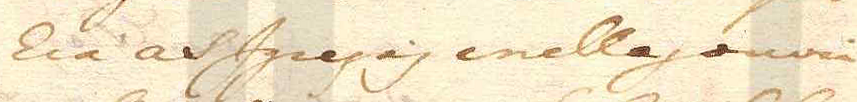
hia as Jgrejas e nellas ouvia
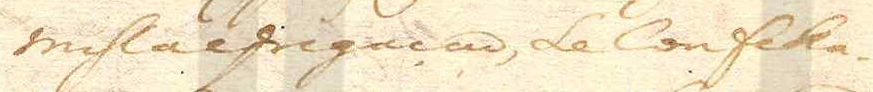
missa e prigaçao, se Confessa
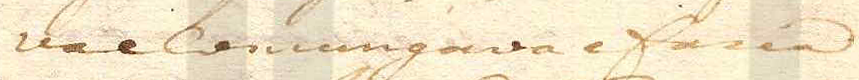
va e comungava e fazia
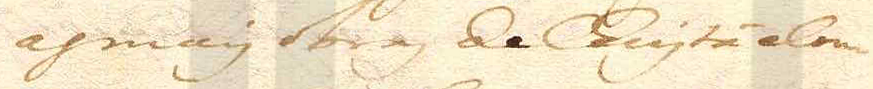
as mais obras de Christã e Com
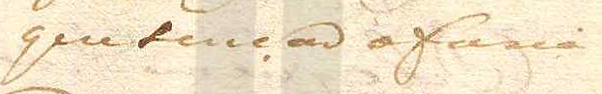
que tençaõ o fazia.
